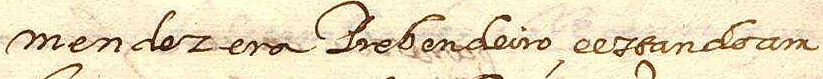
mendez era Prebendeiro, e estando am
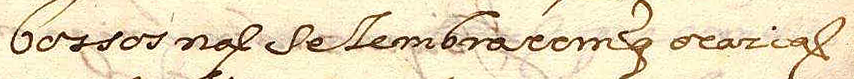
bos sos naõ se lembrar em q̄ ocaziaõ
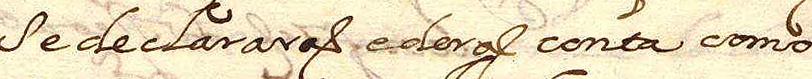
se declararaõ e deraõ conta como
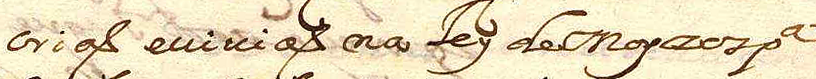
criaõ e uiuiaõ na Ley de moyzes pa
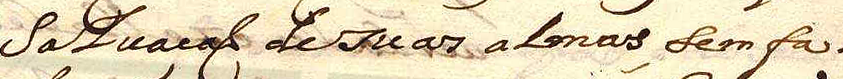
Saluaçaõ de suas aLmas, sem fa
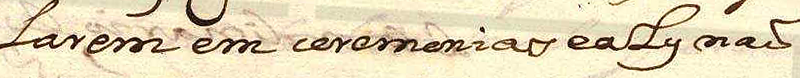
Larem em ceremonias e aLy naõ
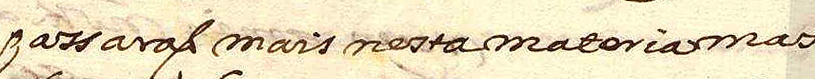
passaraõ mais nesta materia mas
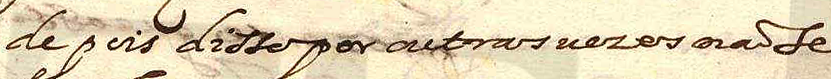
depois disse por outras uezes naõ se
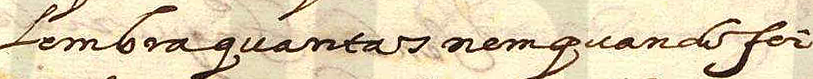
Lembra quantas nem quando foi
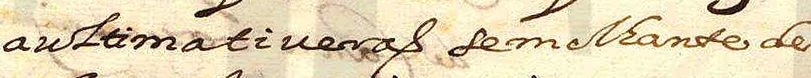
a uLtima tiueraõ semelhante de
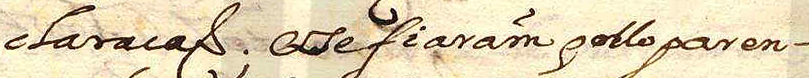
cLaraçaõ; e se fiaram pello paren
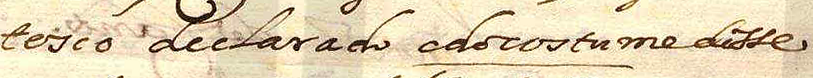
tesco decLarado e do costume disse
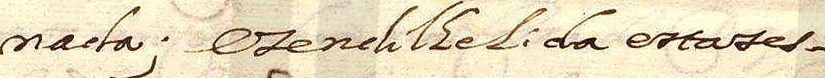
nada; e sendolhe Lida esta ses
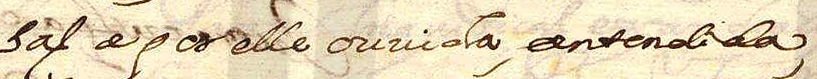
são e por elle ouuida, e entendida,
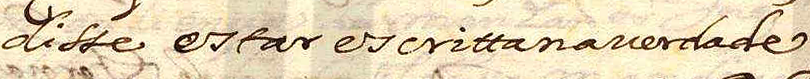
disse estar escritta na uerdade
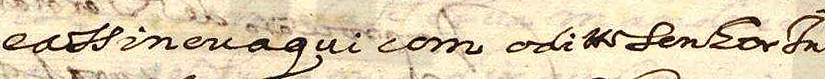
e assinou aqui com o ditto senhor In
